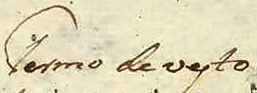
Termo de vesto
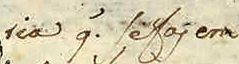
ria q̄. se fes em
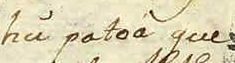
hū patoa que
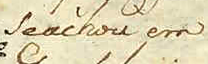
se achou em
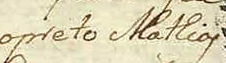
o preto Mathias
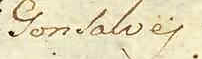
Gonsalves
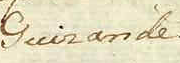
Guizande
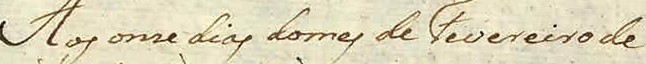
Aos onze dias do mes de Fevereiro de
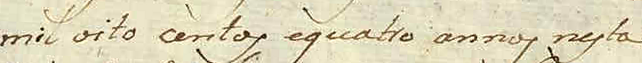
mil oitocentos e quatro annos nesta
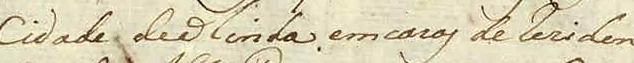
Cidade de Olinda, em cazas de Reziden
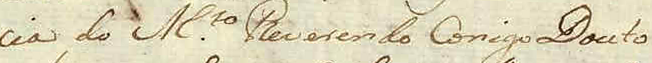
cia do M.to Reverendo Conigo Douto
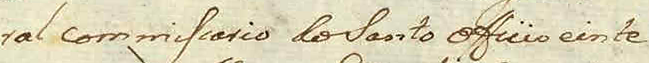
ral commissario do Santo officio e inte
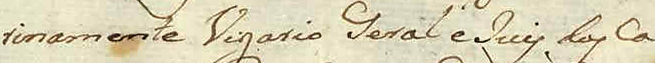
rinamente Vigario Geral e Iuis dos Ca
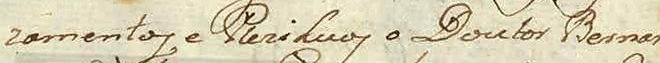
zamentos e Reziduos o Doutor Bernar
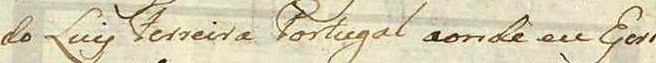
do Luis Ferreira Portugal aonde eu Escri
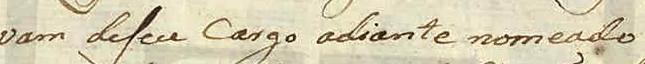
vam de seu Cargo adiante nomeado
